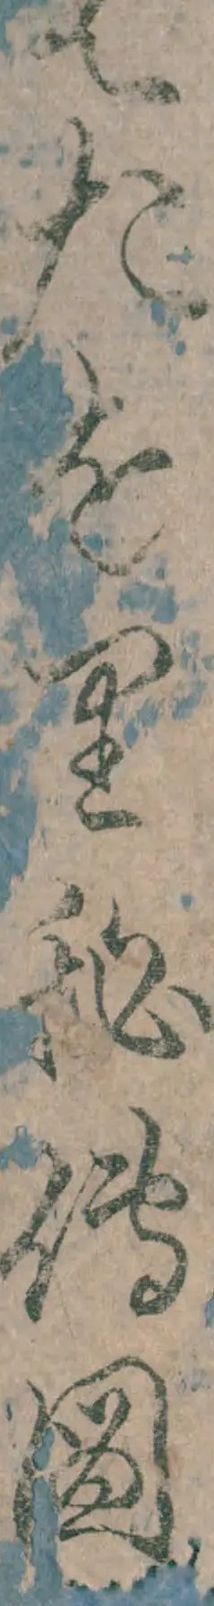はたをり秘伝図

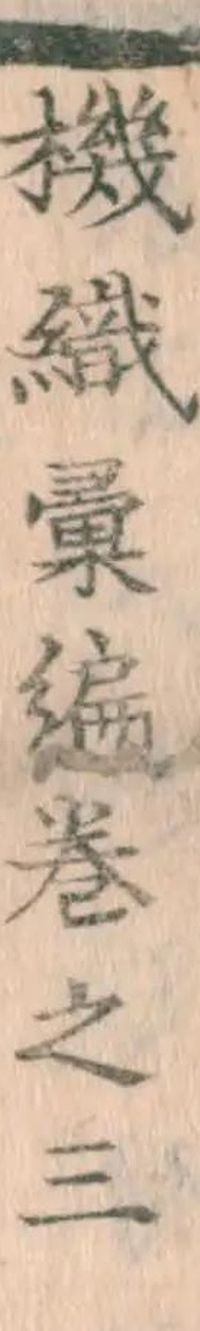機織彙編巻之三
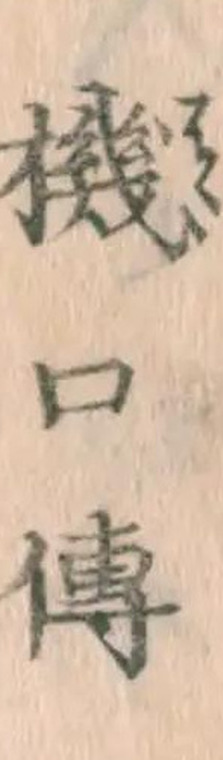機口伝
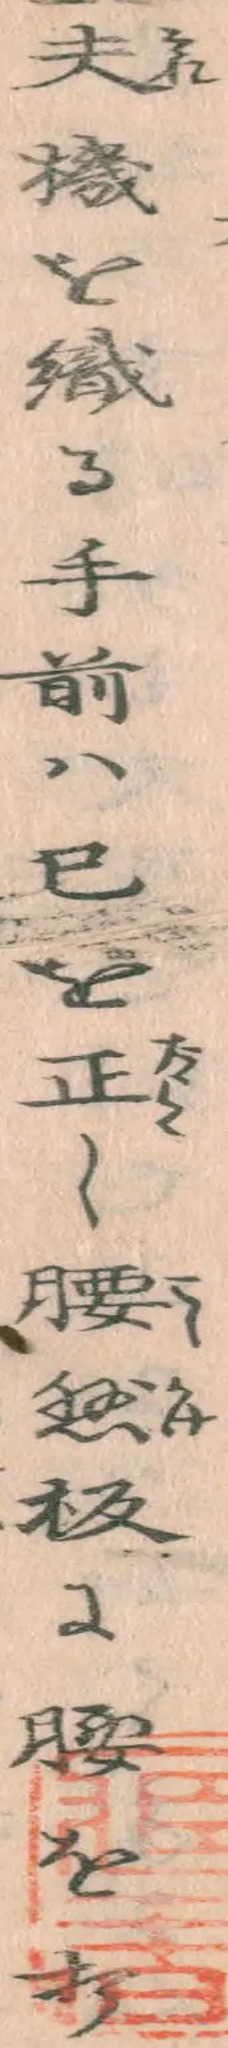一夫機を織る手前は巳を正し腰懸板に腰を打
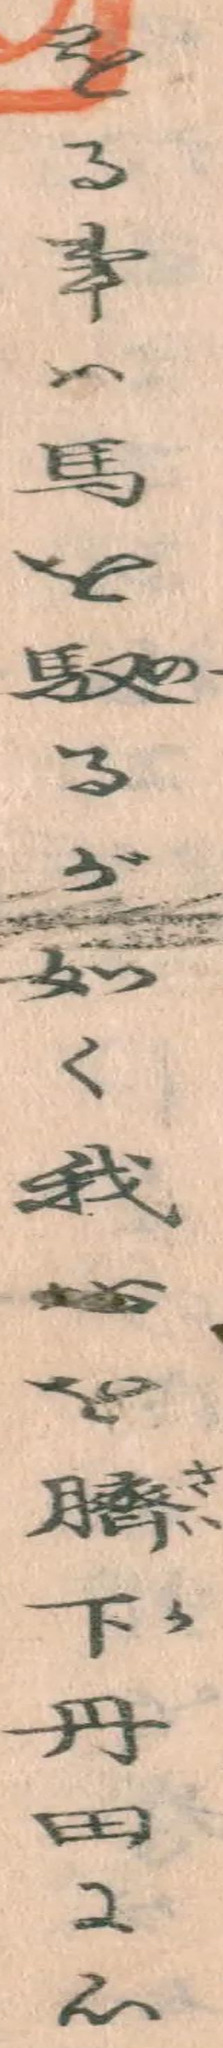懸る事は馬を馭るが如く我心を臍下丹田に心
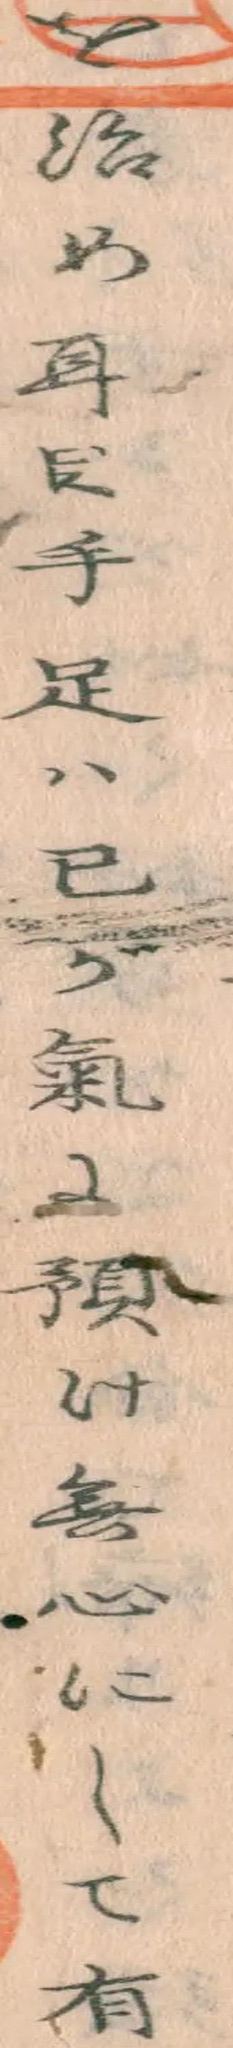を治め耳目手足は巳が気に預け無心にして有
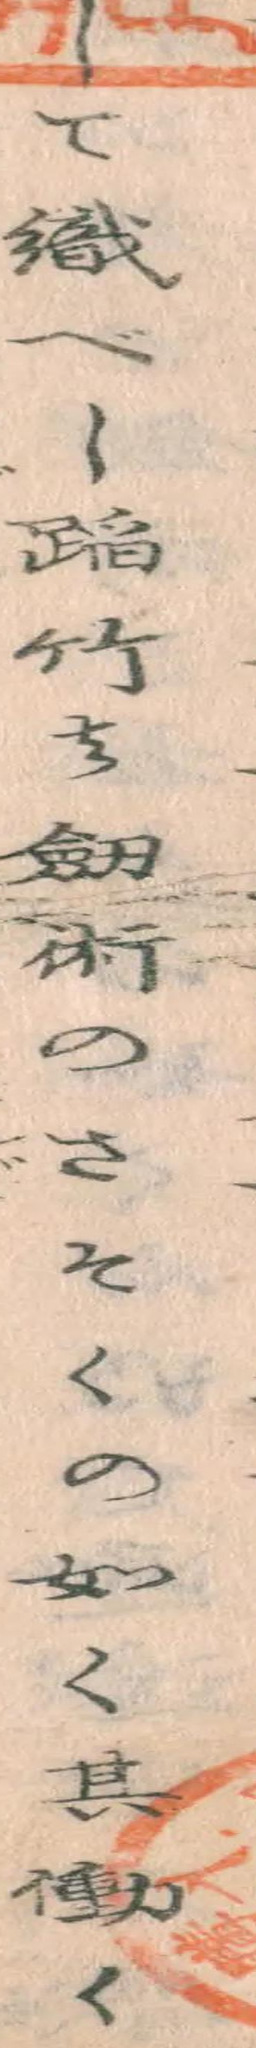して織べし蹈竹は剣術のさそくの如く其働く
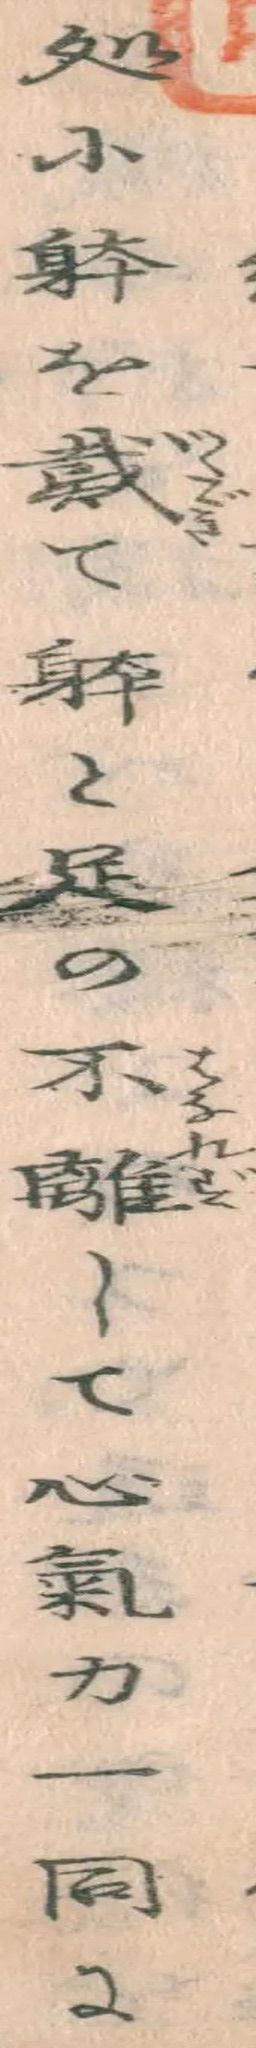処に体を戴て体と足の不離して心気力一同に
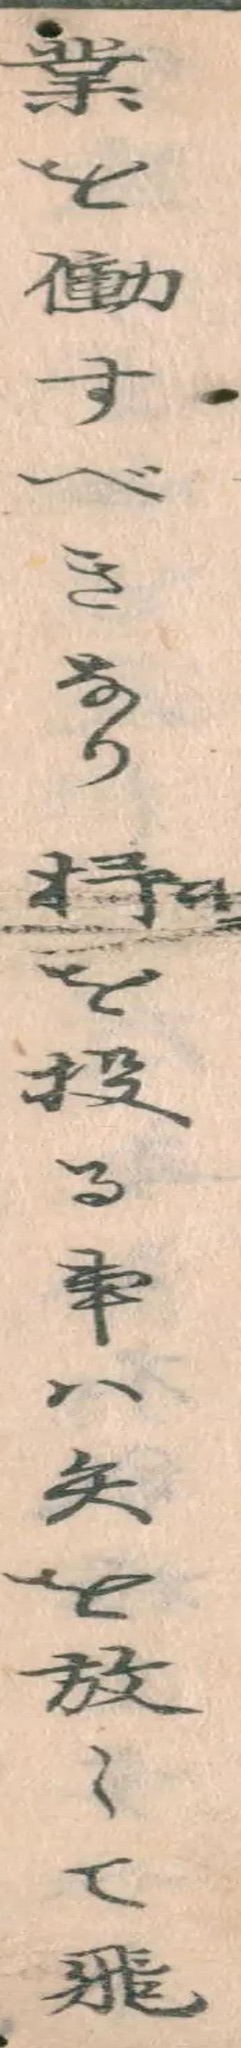業を働すべきなり杼を投る事は矢を放して飛
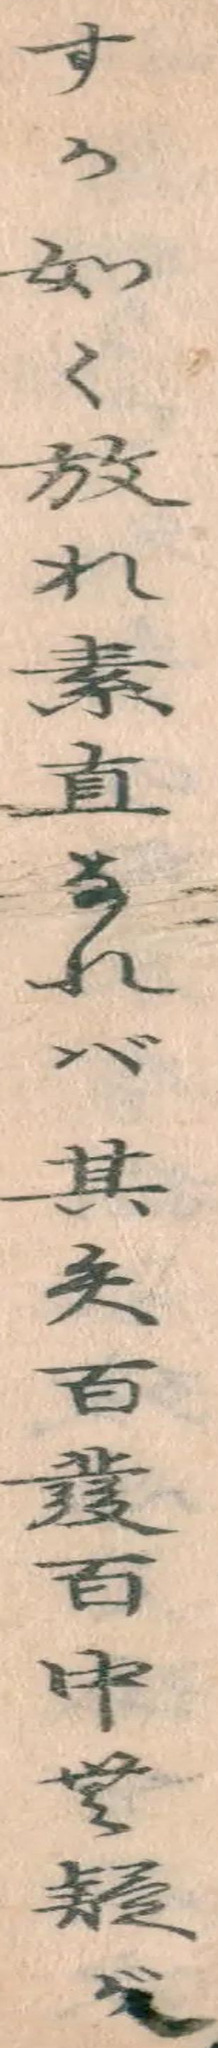すか如く放れ素直なれば其矢百発百中無疑が
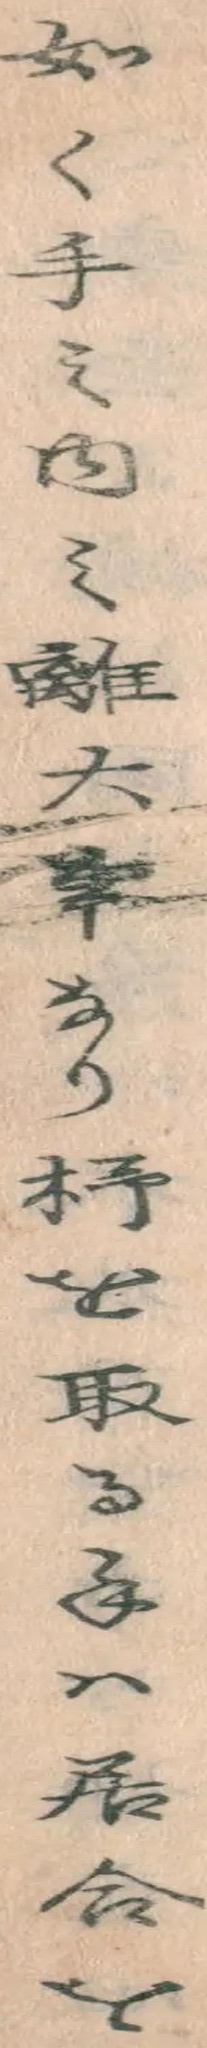如く手之内之離大事なり杼を取る手は居合を
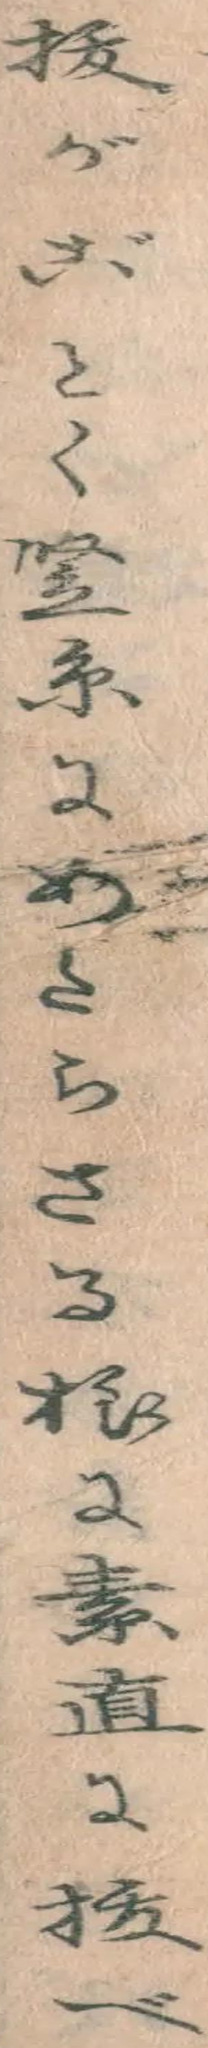抜がごとく竪糸にあたらさる様に素直に抜べ

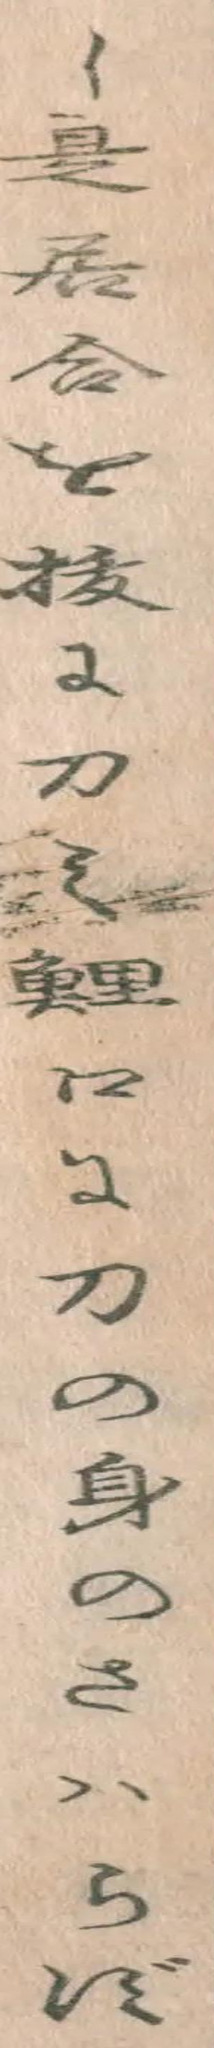し是居合を抜に刀之鯉口に刀の身のさはらず
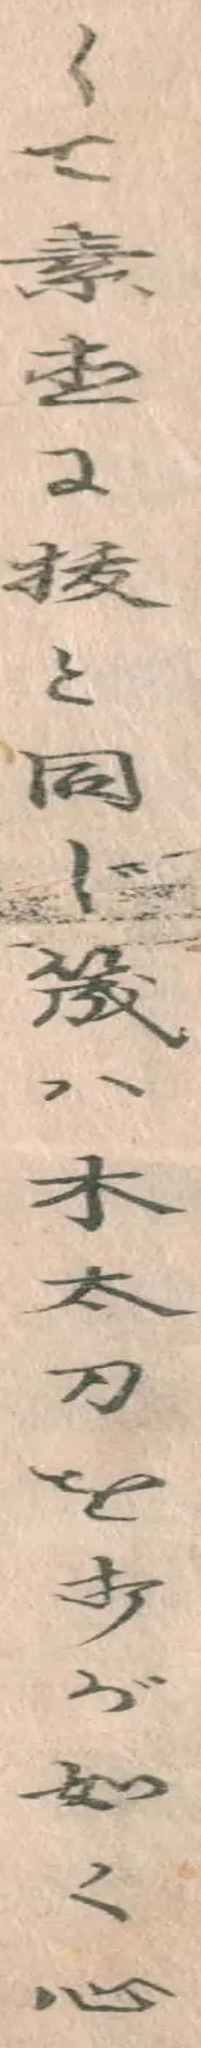して素直に抜と同じ筬は木太刀を打が如く心
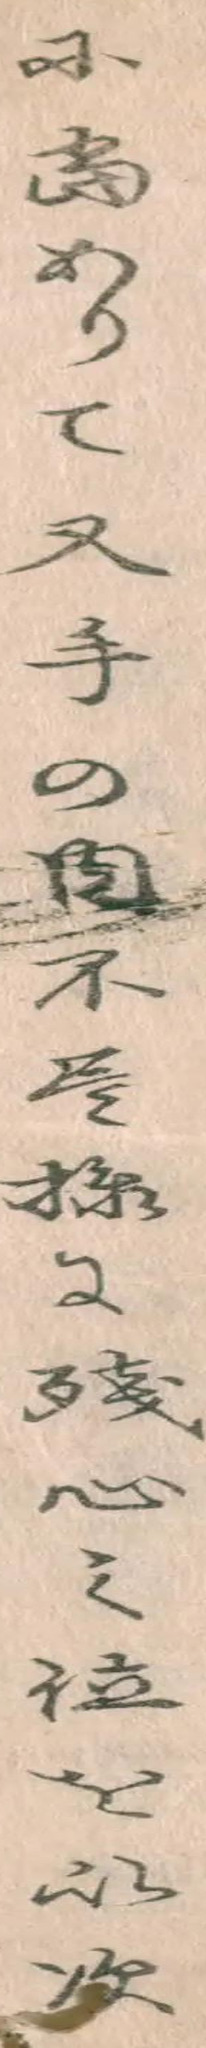に当ありて又手の内不尽様に残心之位を以次
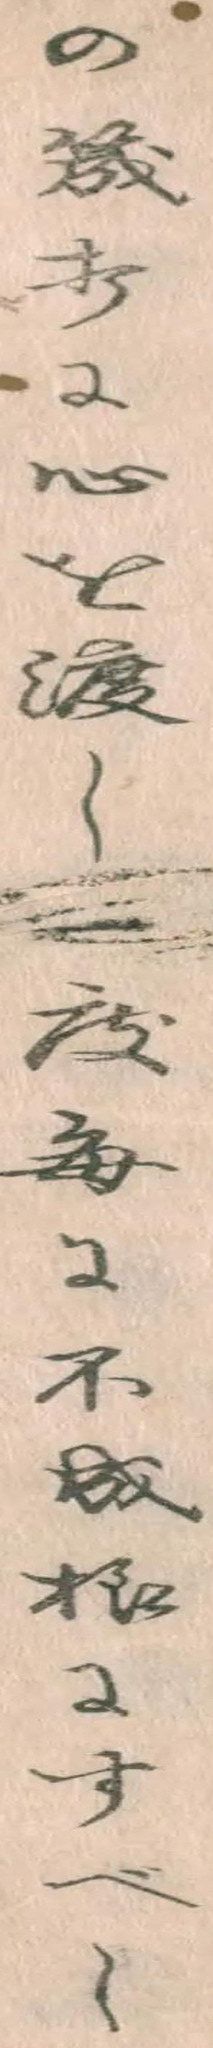の筬打に心を渡し一度毎に不成様にすべし
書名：機織彙編 5巻. [2]
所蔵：国立国会図書館 National Diet Library, JAPAN
